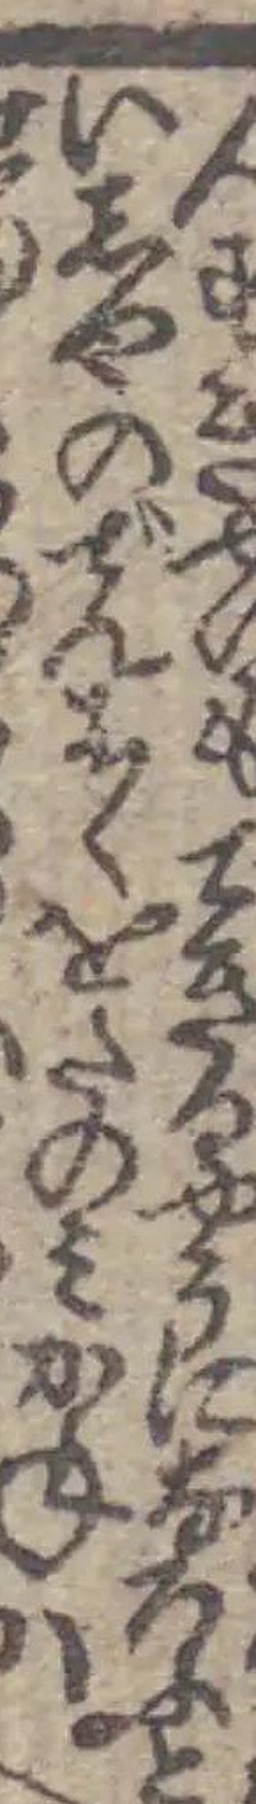いしやのでんはくをたのみかねは
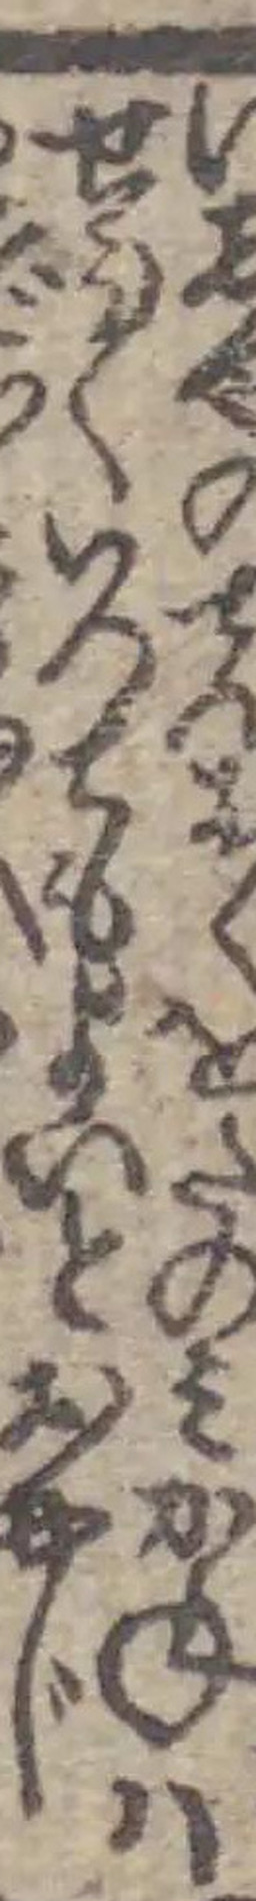せう〳〵いつてもよいとおやじ
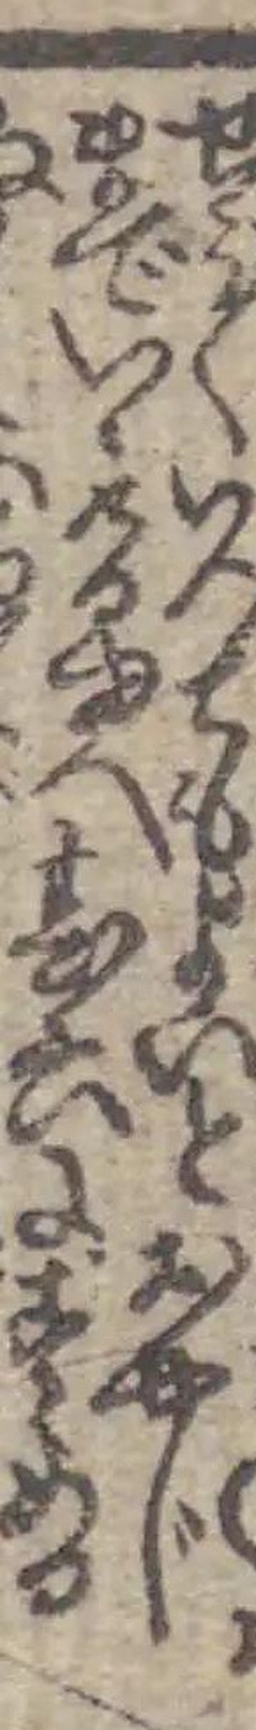までいゝけるゆへ甚六にすゝめる
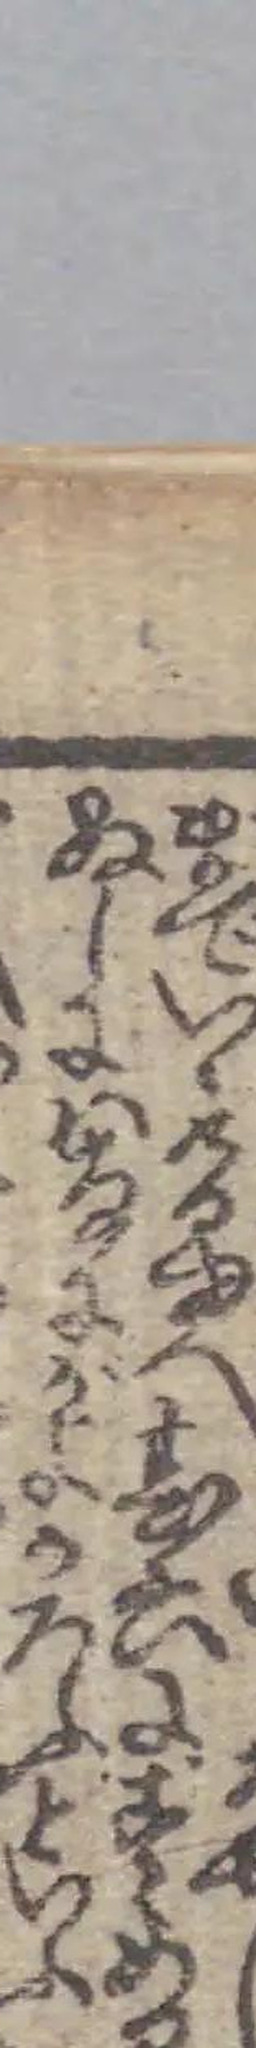ぬしにはなにがよかろふといふ
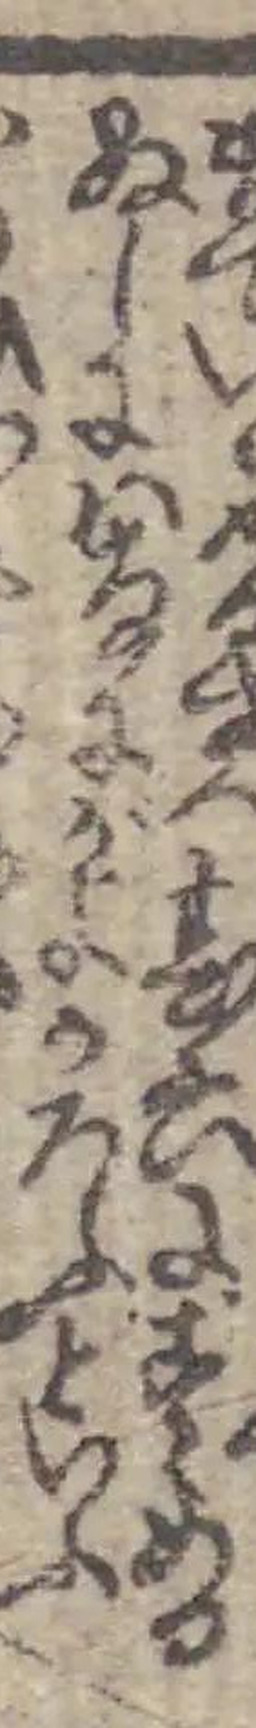ぬしにはなにがよかろふといふ
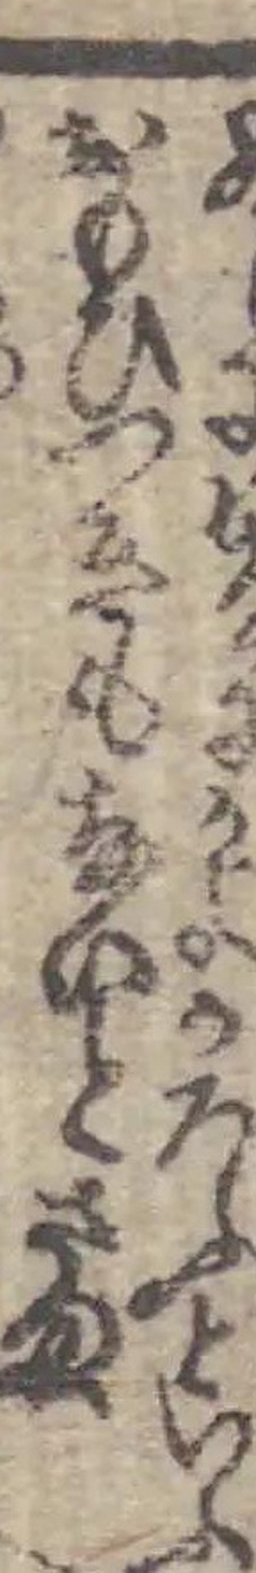おもひつきもないとさま
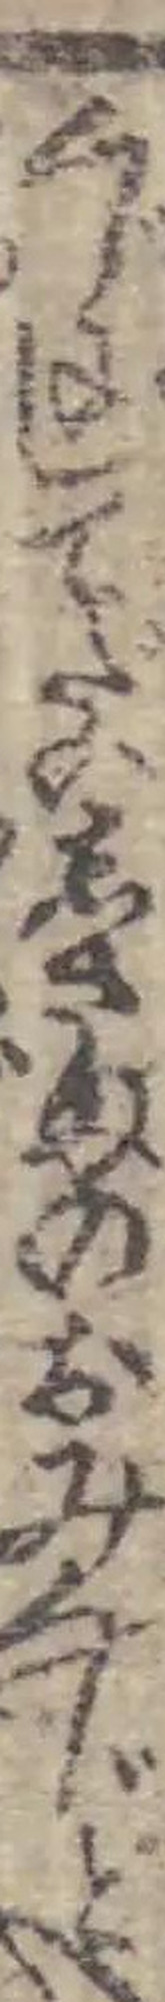くじにしてだいしさまのおみくじと
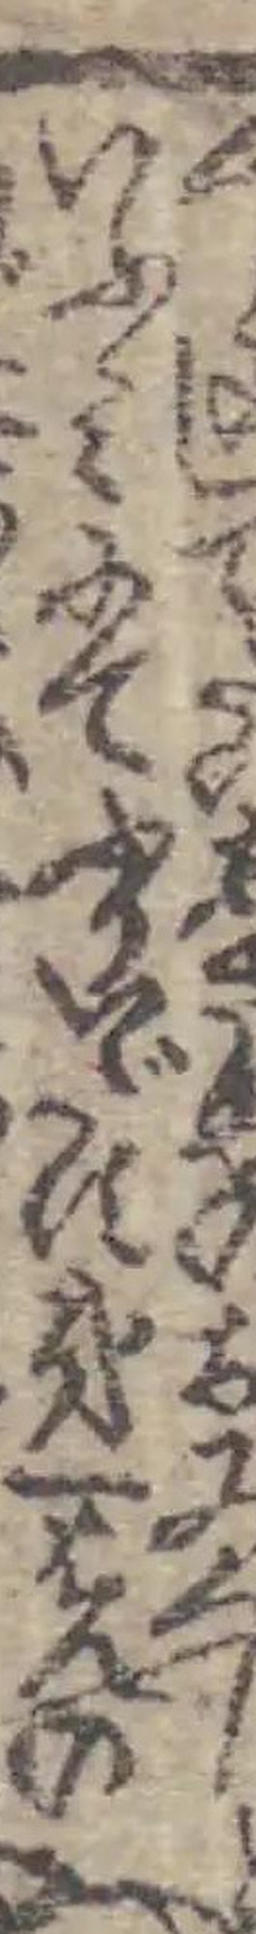いふみにてふりいだす第一はんの
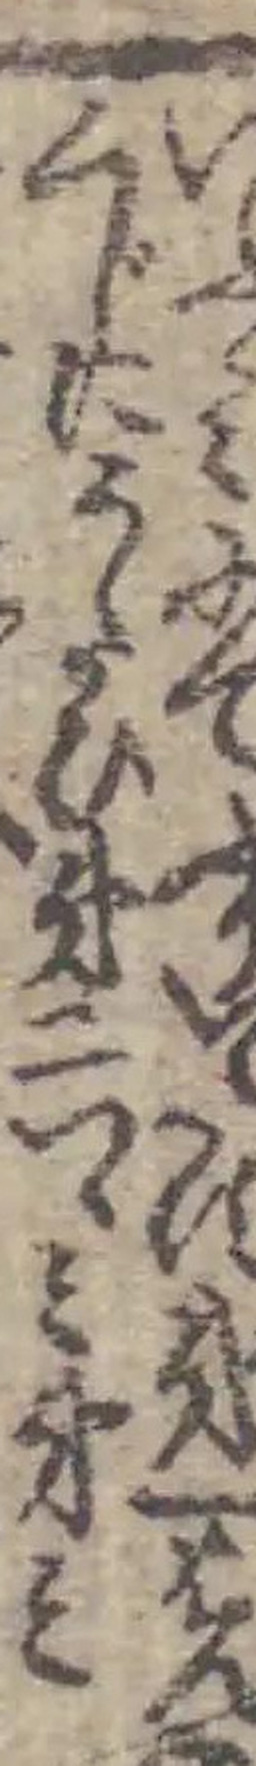くじにうたひ第二つゝみ第三
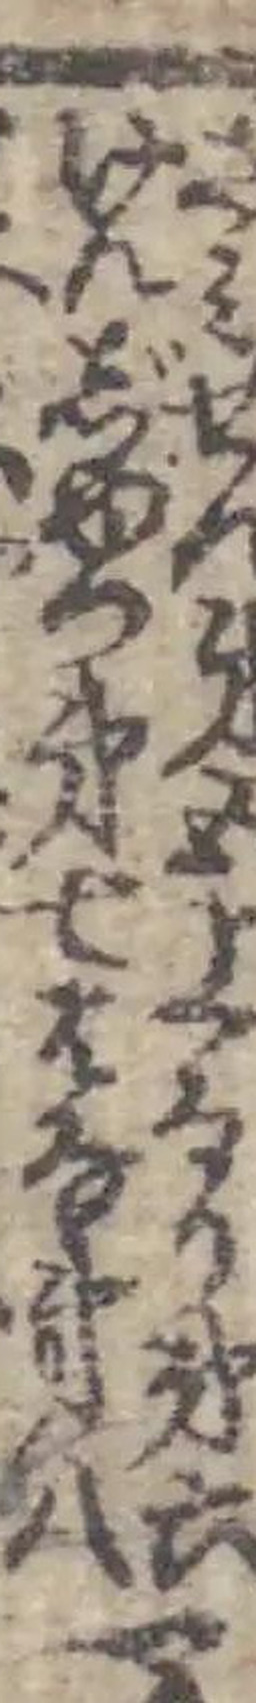けんじゆつ第七はな第八
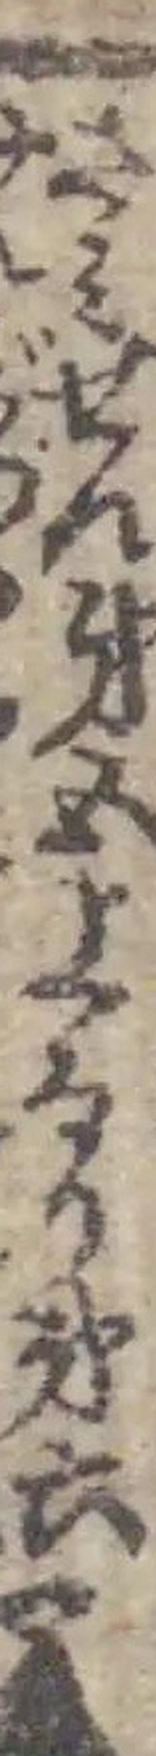さみせん第五上るり第六
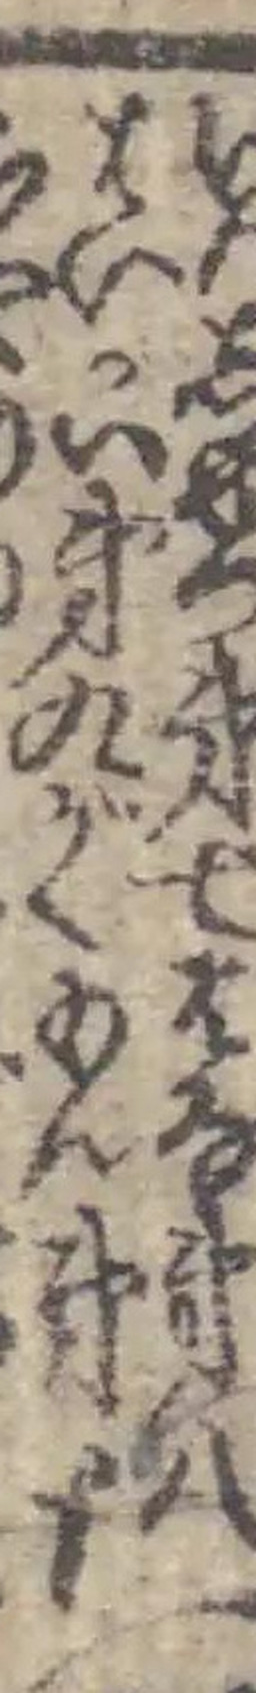はいかい第九がくもん第十
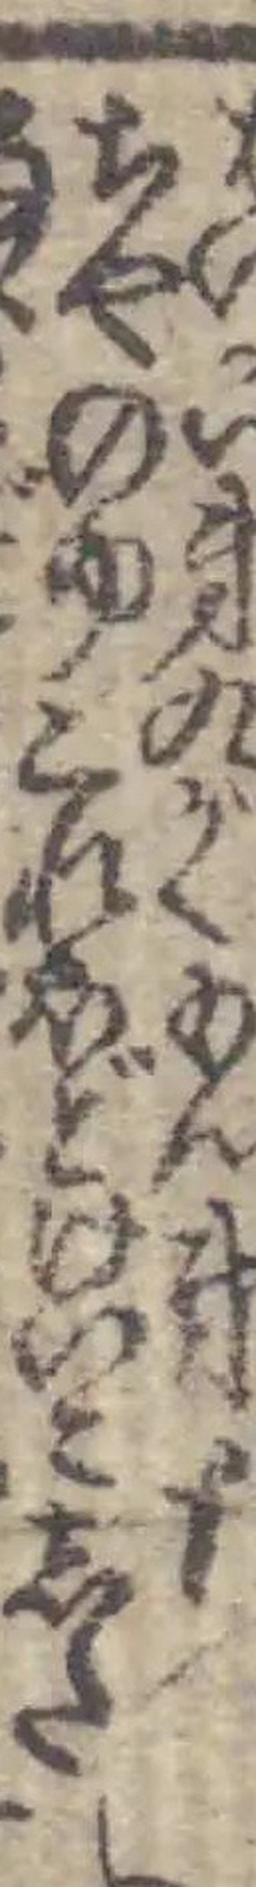ちやのゆこれほどけいこした
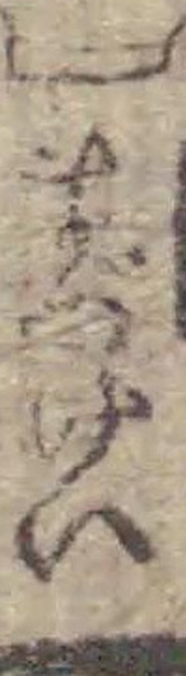まづけい
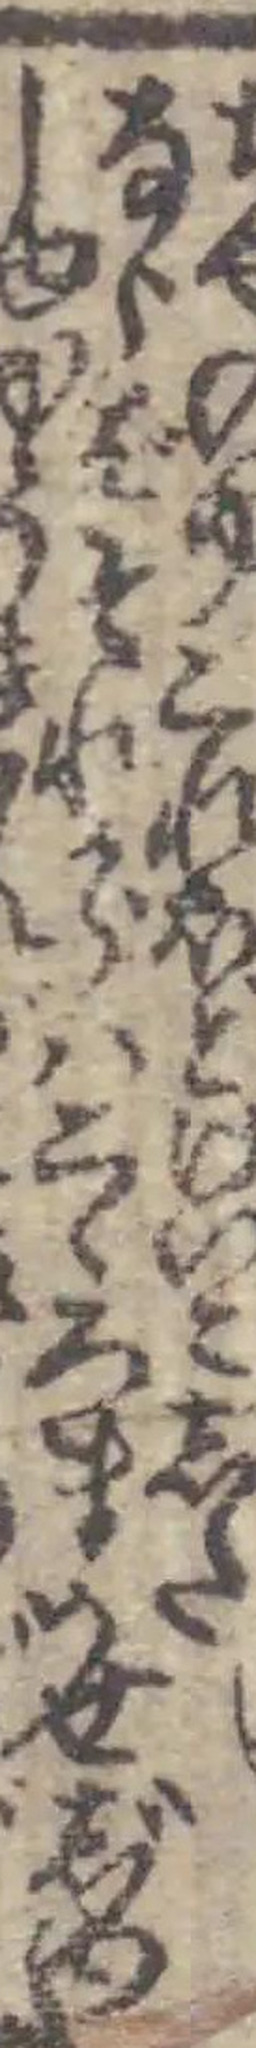ならばそれからはこゝろまかせじゆ
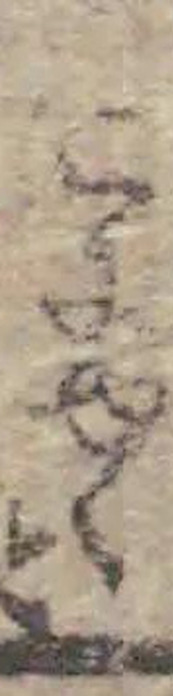こにゆくと
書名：津以曽無弟の甚六 3巻
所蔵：国立国会図書館 National Diet Library, JAPAN
